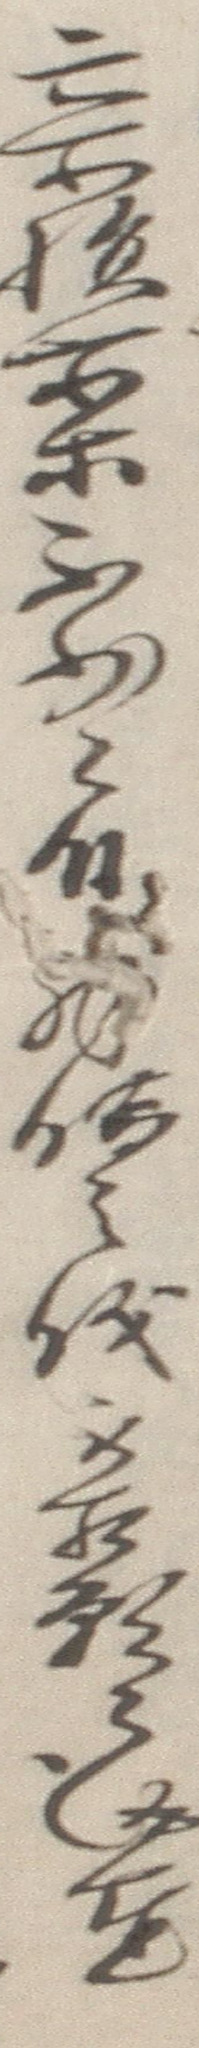亡所損所等不少二付拝借之儀被相願候趣達
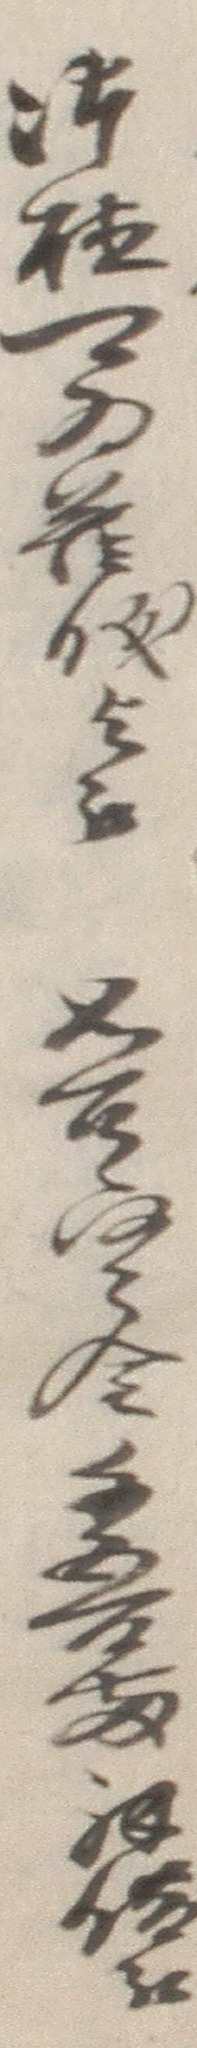御聴可為難儀と被思召候仍之金千五百両拝借被
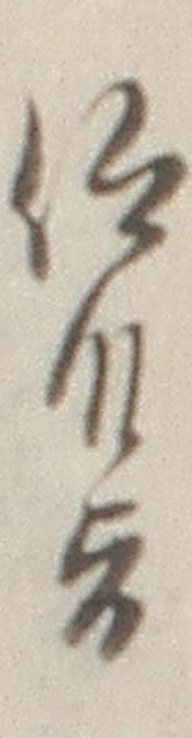仰付旨
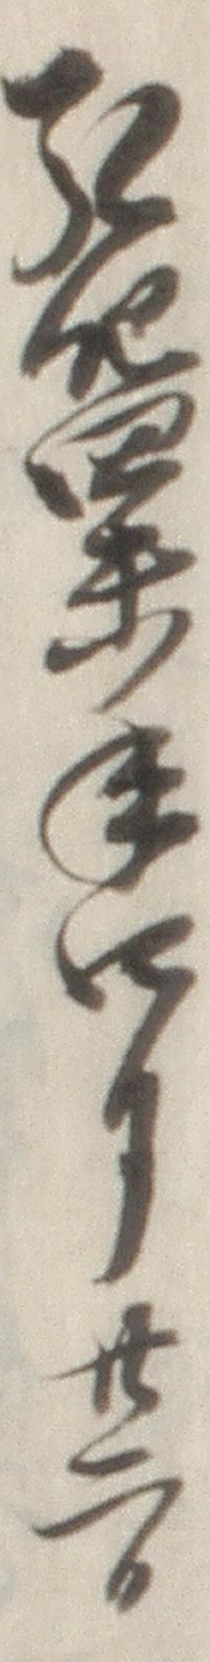弘化四未年四月廿二日
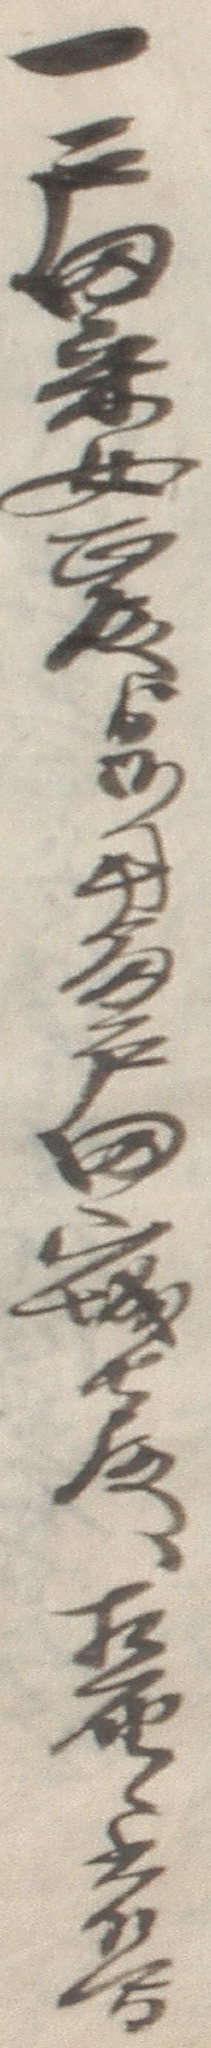一戸田采女正殿ゟ御用番戸田山城守殿ㇸ相届候書付写
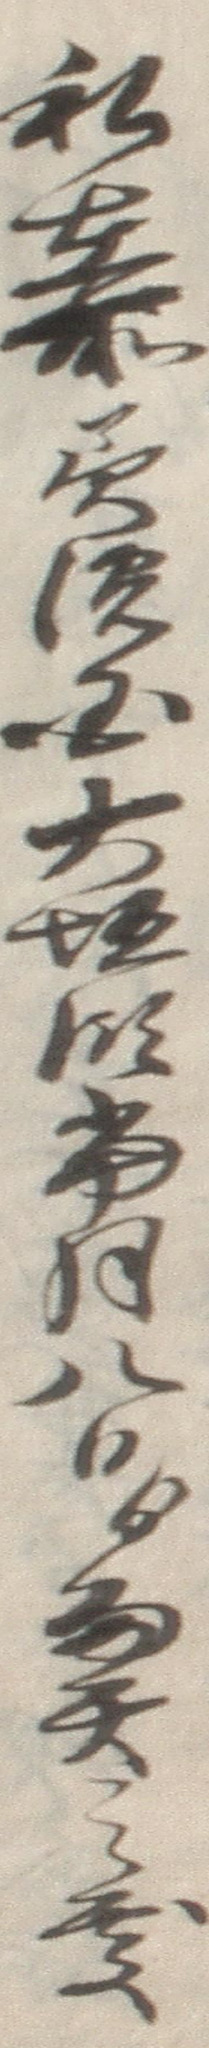私在所美濃国大垣領当月八日ゟ雨天之処
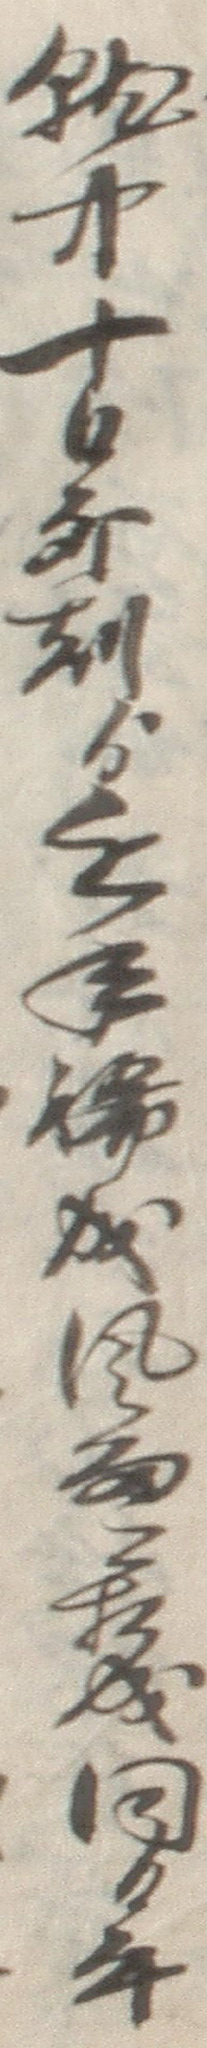就中十日卯刻ゟ近年稀成風雨二相成同日午
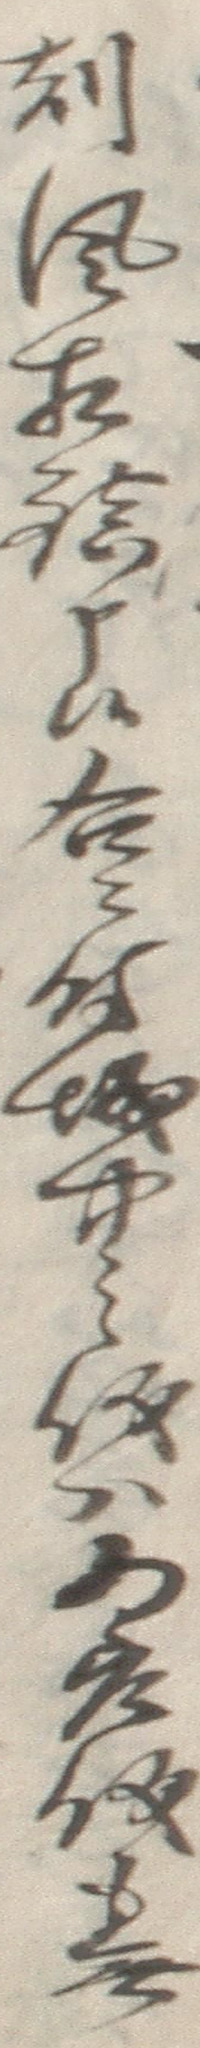刻風相鎮申候右二付城中之儀ハ為差儀も無
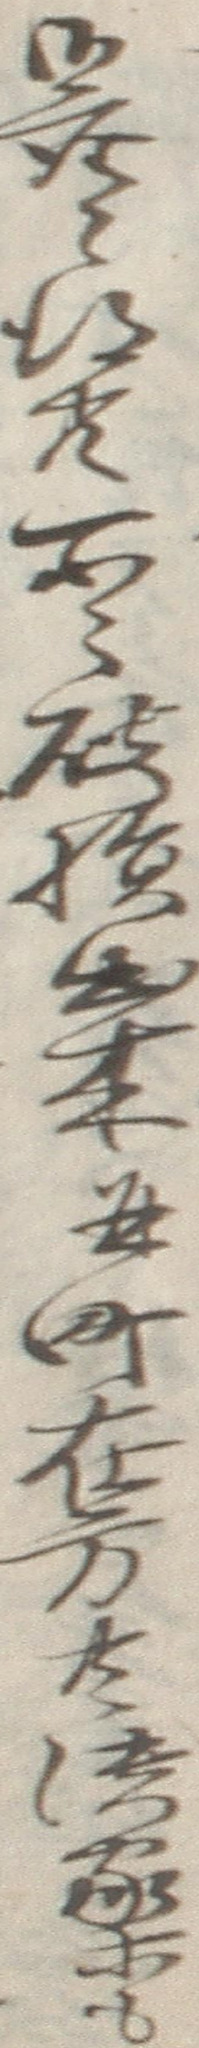御座候得共所々破損出来并町在所方共潰家等も
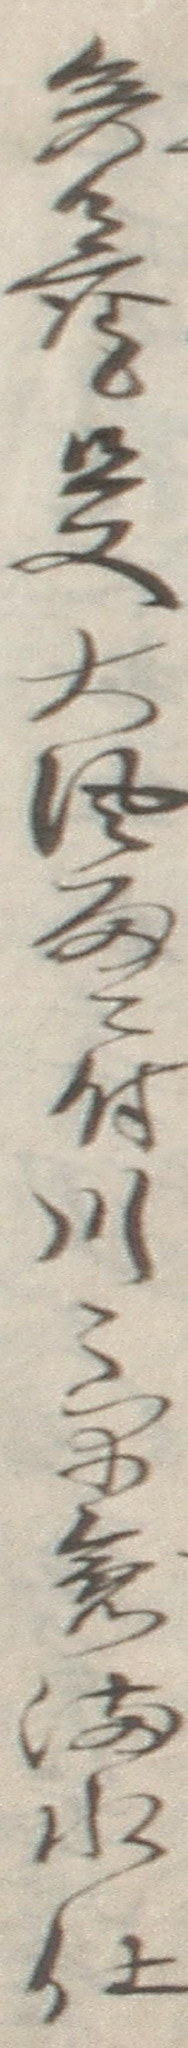多御座候且又大風雨二付川々早急満水仕

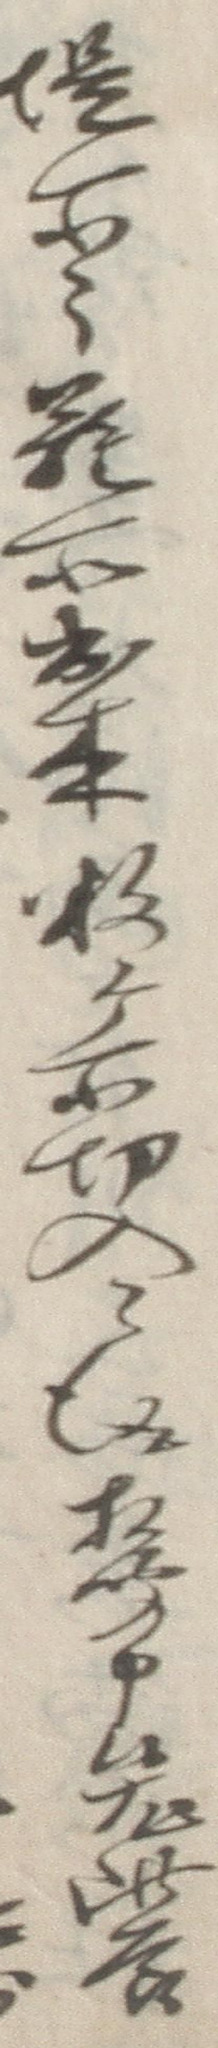堤所々崩所出来数ヶ所押入候趣相聞申候尤此節
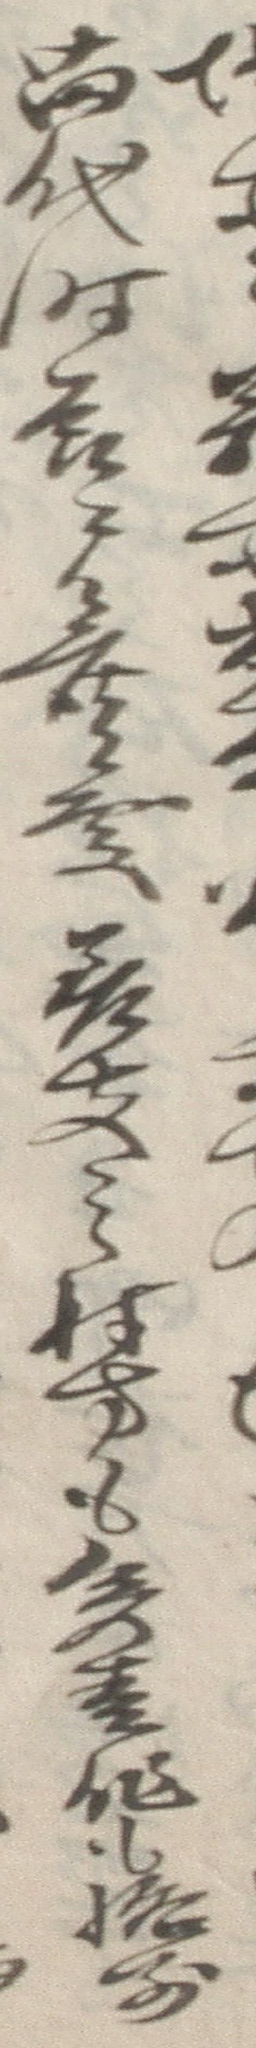苗代時節二御座候処差支之村方も多麦作も格別
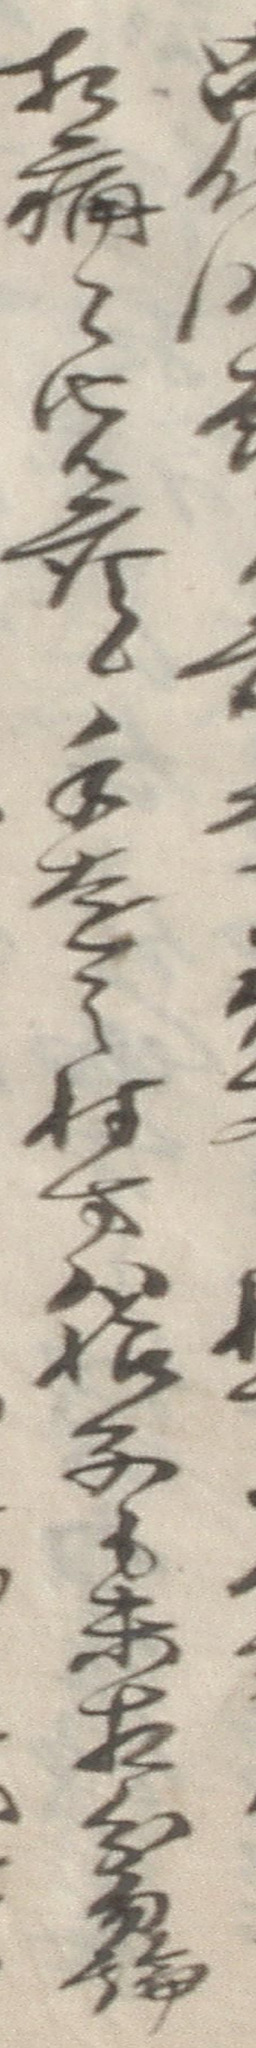相痛候由二御座候手遠之村方ハ様子も相分勿論
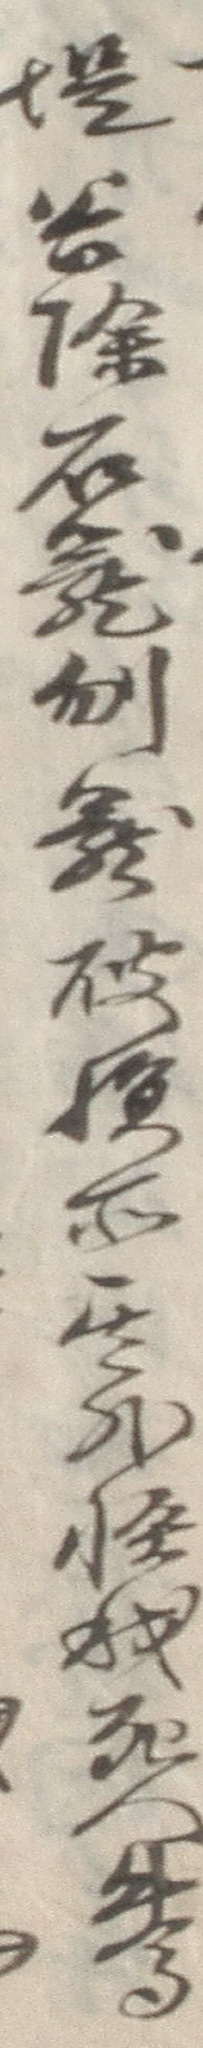堤谷除石蔵刎蔵破損所其外怪我死人牛馬
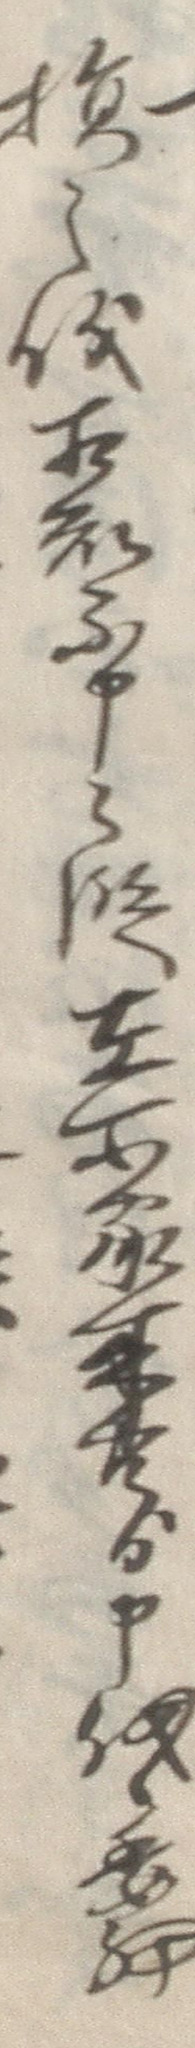損之儀相知不申候段在所家来共ゟ申越候委細
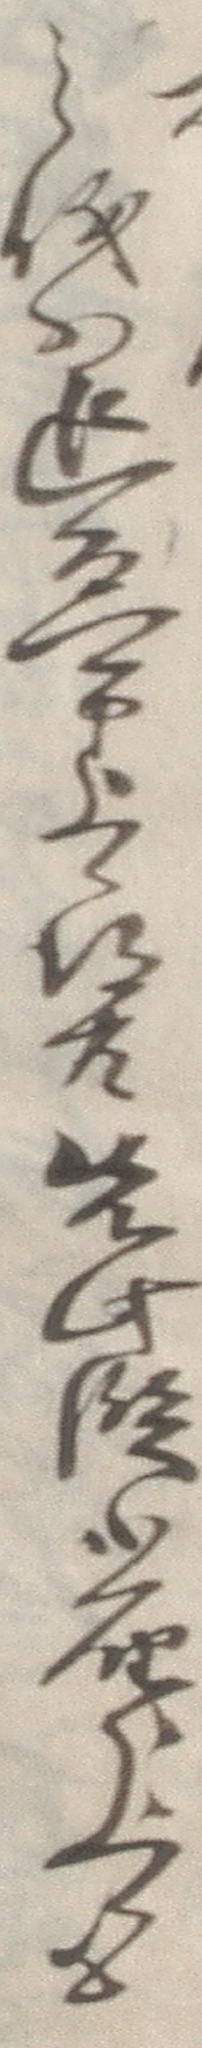之儀ハ追而可申上候得共先此段御届申上候以上
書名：信州地震一件
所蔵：東京大学地震研究所図書室 Earthquake Research Institute Library, The University of Tokyo, JAPAN
